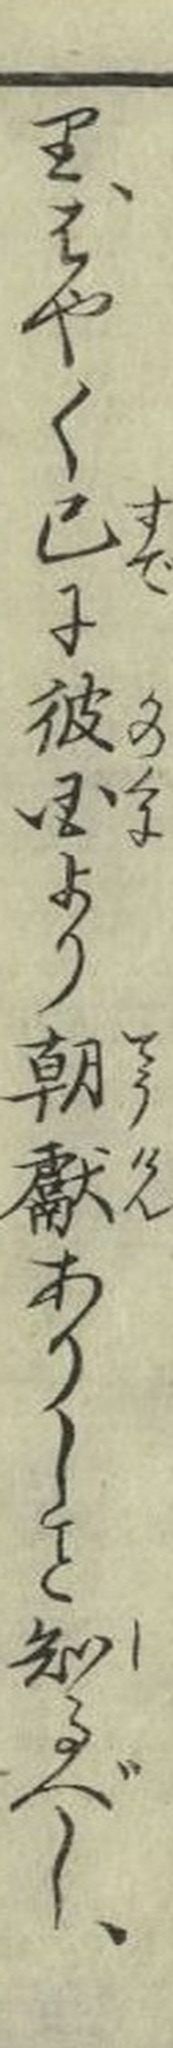り、はやく已に彼国より朝献ありしこと知るべし、
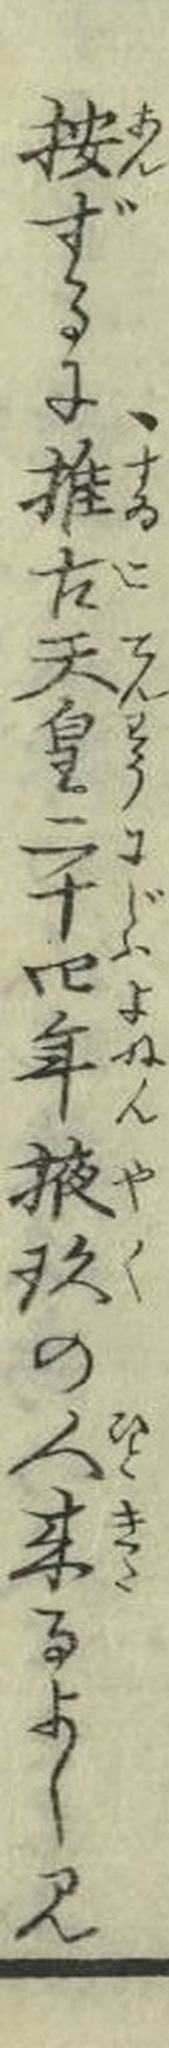按ずるに、推古天皇二十四年掖玖の人来るよし見
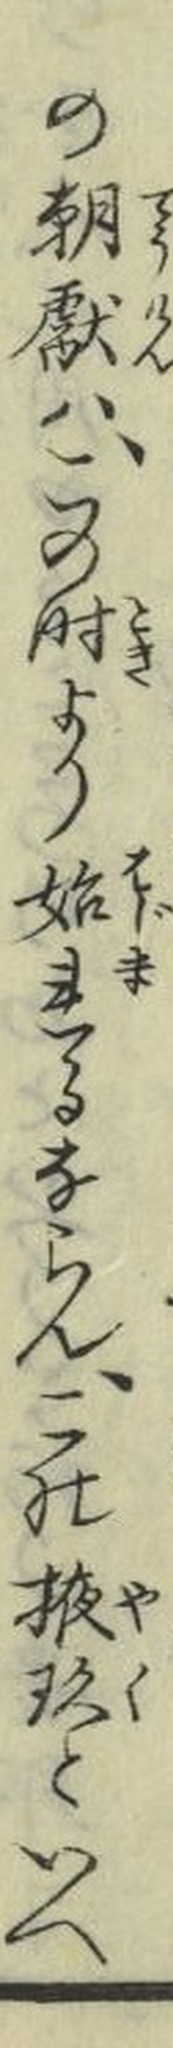の朝献は、この時より始れるならん、この掖玖といへ
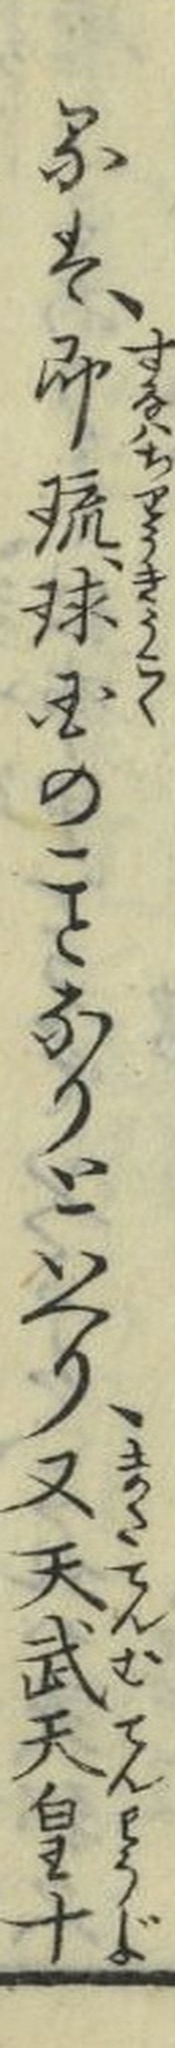るは、即琉球国のことなりといへり、又天武天皇十
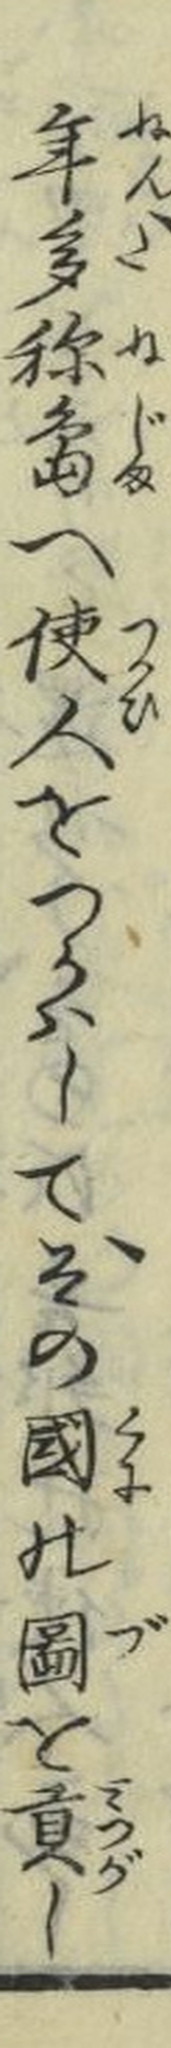年、多祢島へ使人をつかはして、その国の図を貢し
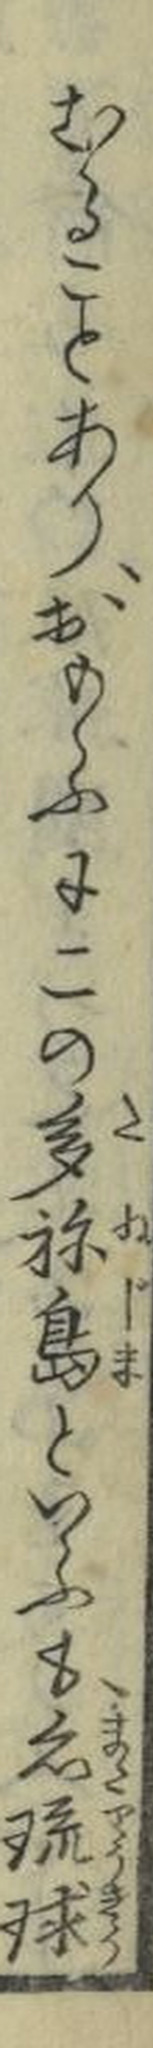むることあり、おもふにこの多祢島といふも、亦琉球
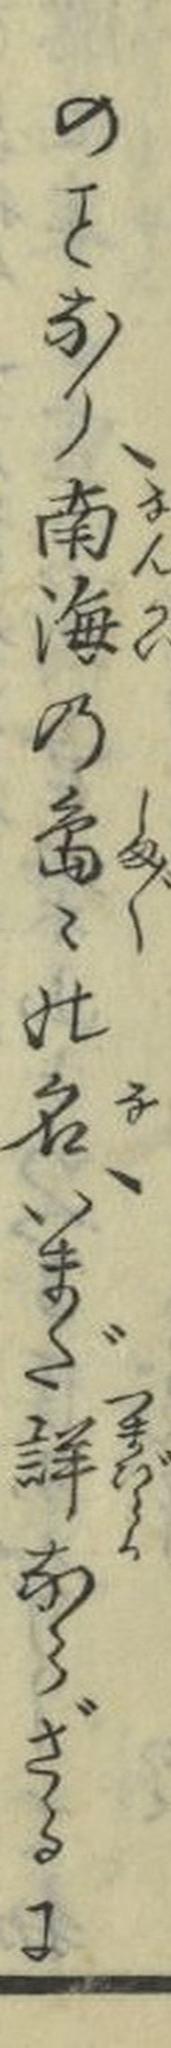のことなり、南海の島々の名、いまだ詳ならざるに
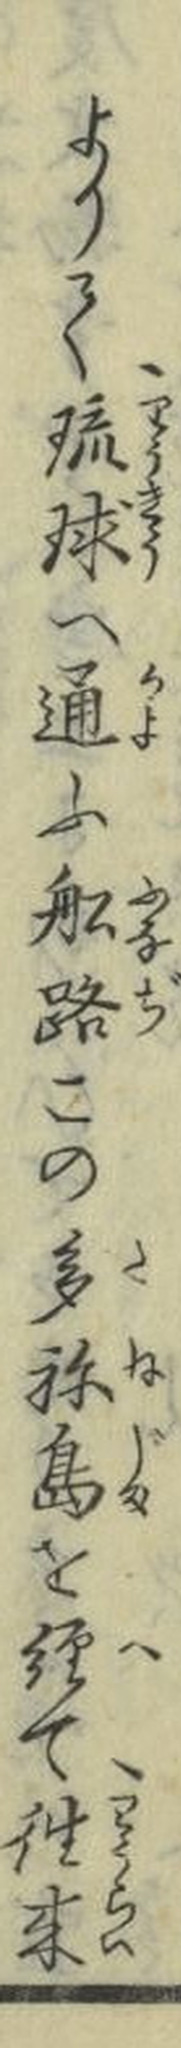よりて、琉球へ通ふ船路この多祢島を経て、往来
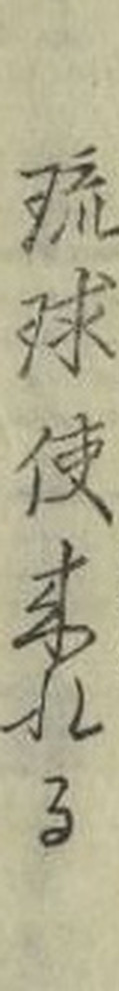琉球使来れる
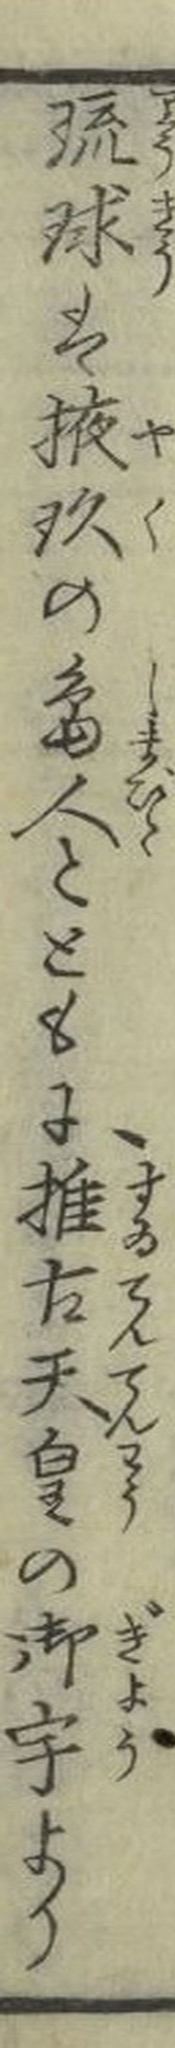琉球は掖玖の島人とともに、推古天皇の御宇より
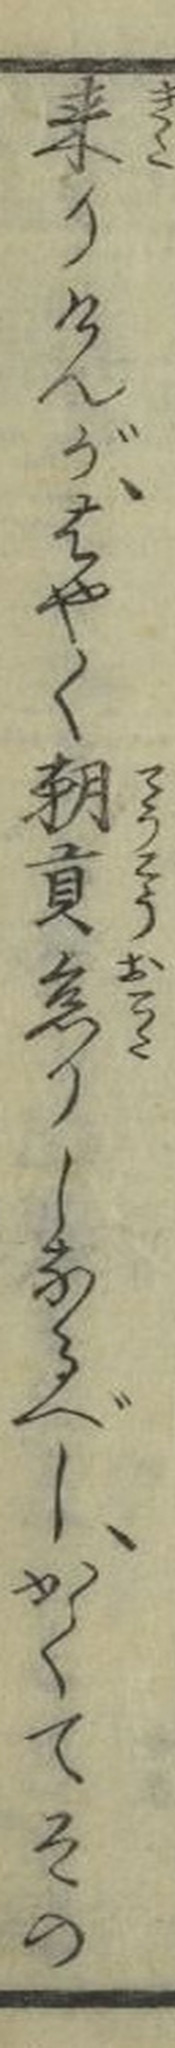来りけんが、はやく朝貢怠りしなるべし、かくてその

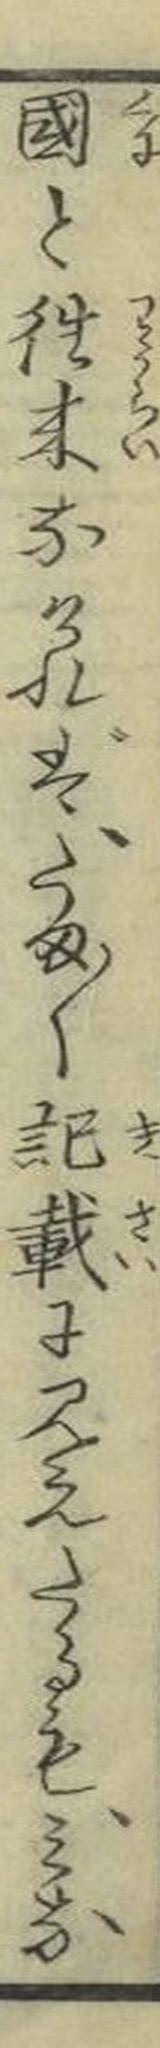国と往来なければ、たま〳〵記載に見えたるも、みな
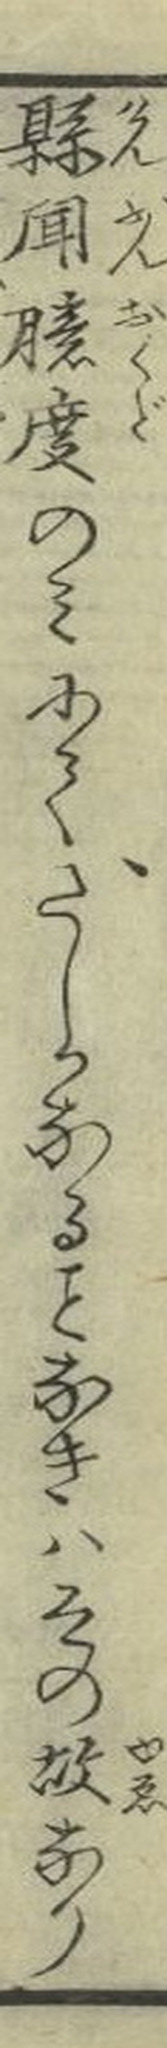県聞臆度のみにて、たしかなることなきはその故なり
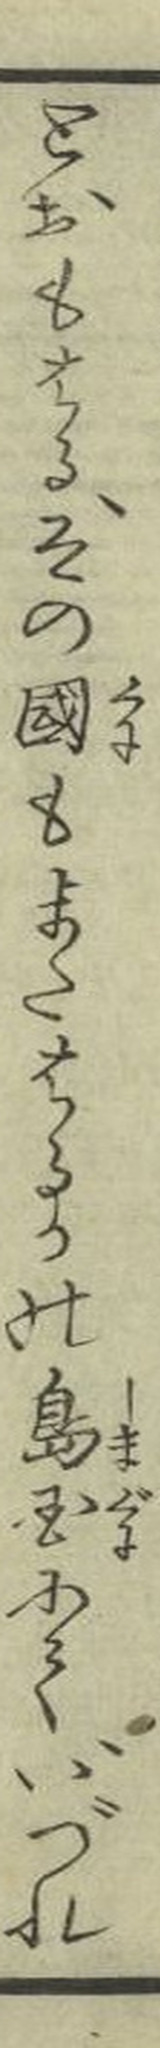とおもはる、その国もまたはるかの島国にて、いづれ
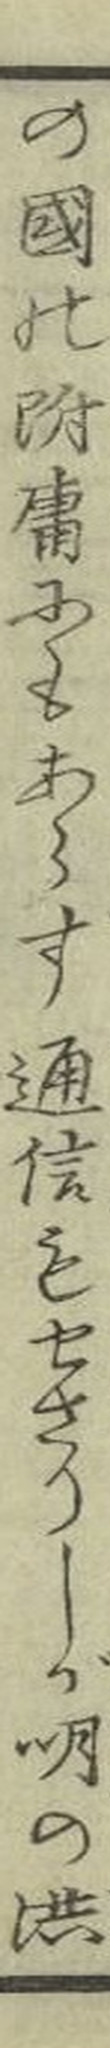の国の附庸にもあらず通信もせざりしが、明の洪
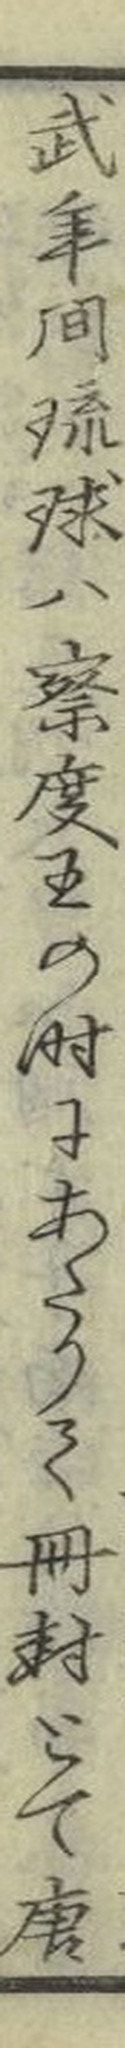武年間、琉球は察度王の時にあたりて冊封とて唐
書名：琉球入貢紀略
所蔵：University of the Ryukyus Library
